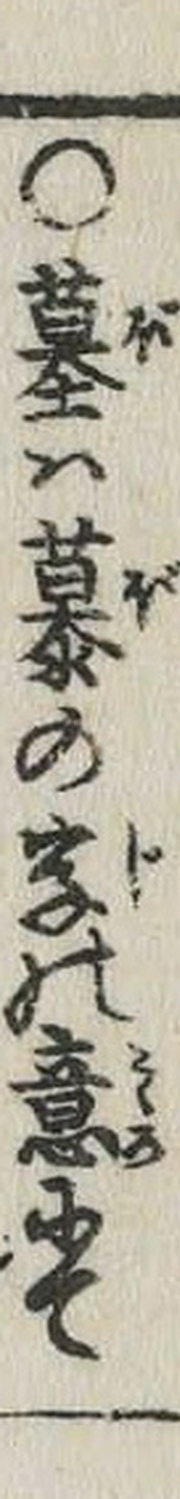○墓は慕の字の意にて
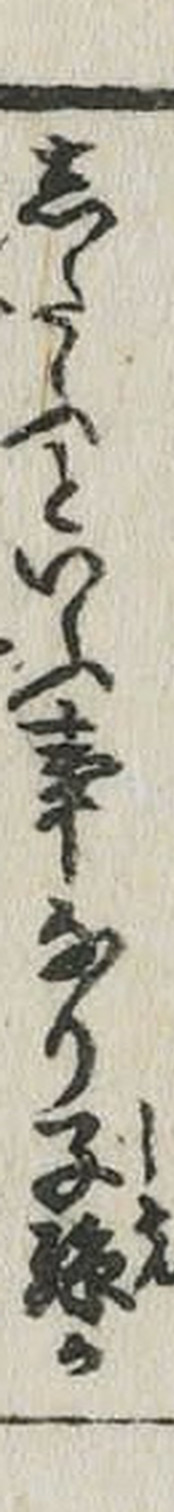したふといふ事なり子孫か
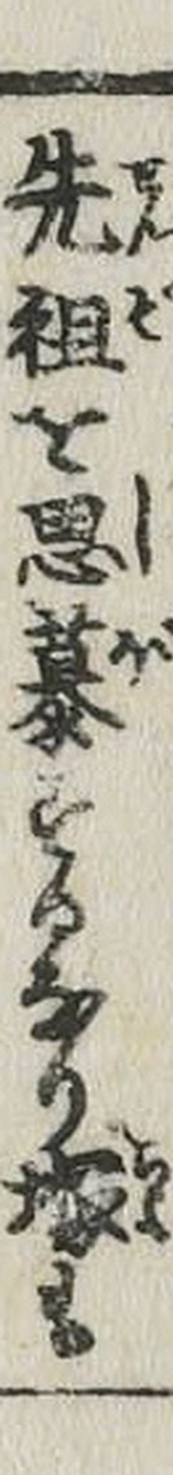先祖を思慕するなり塚も
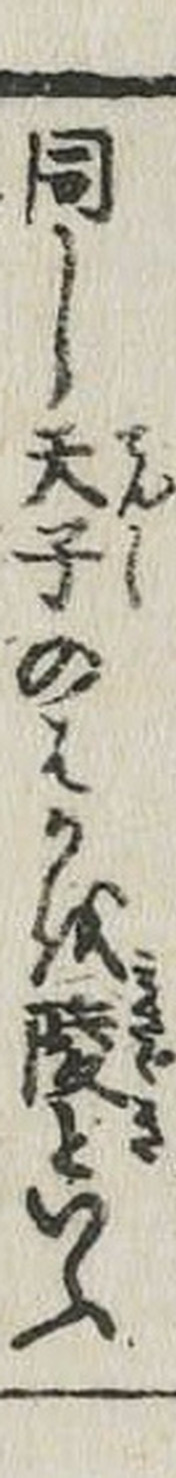同し天子のはかを陵といふ
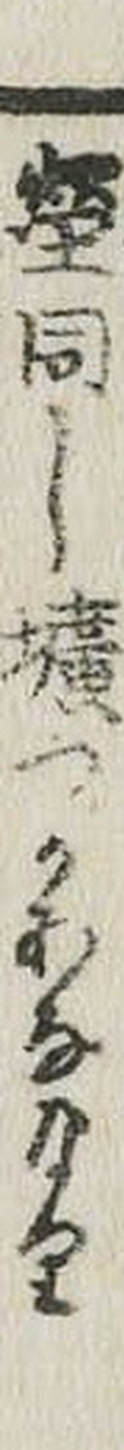塋同し壙つかあななり
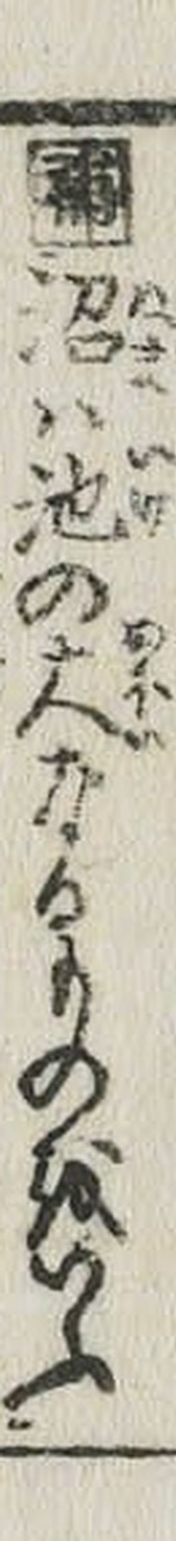補沼は池の大なるものをいふ
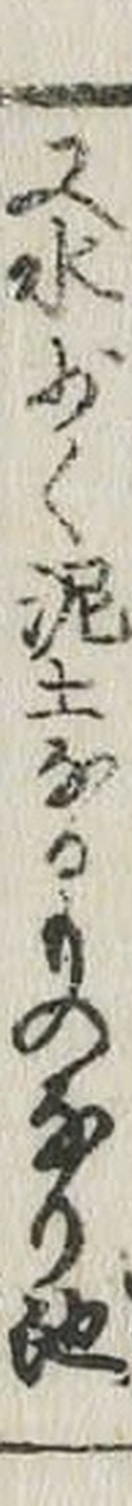又水少く泥土なるものなり池
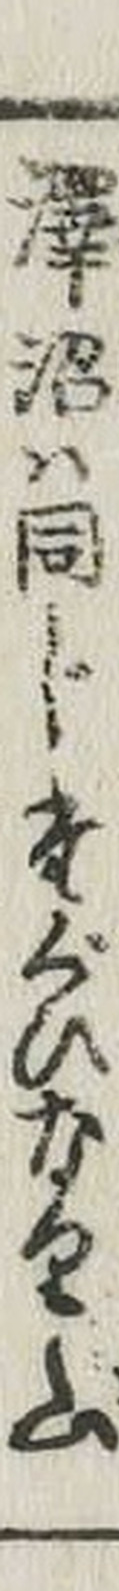沢沼は同じたぐひなり山
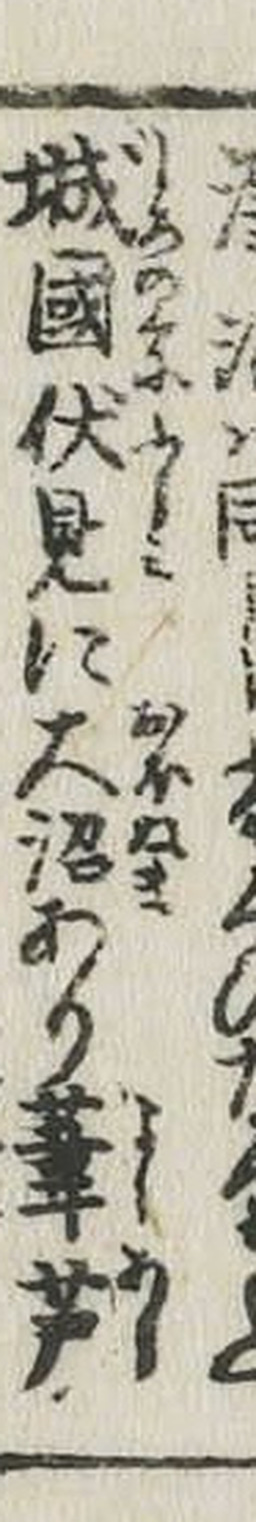城国伏見に大沼あり葦芦
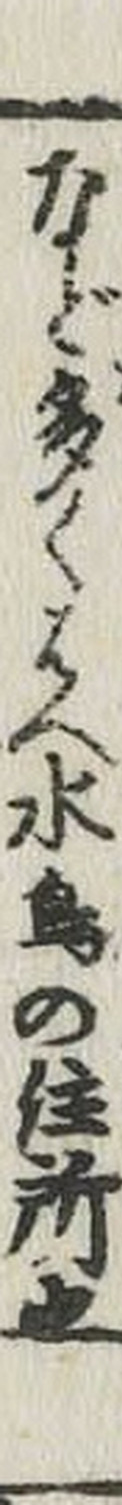など多くはへ水鳥の住所也
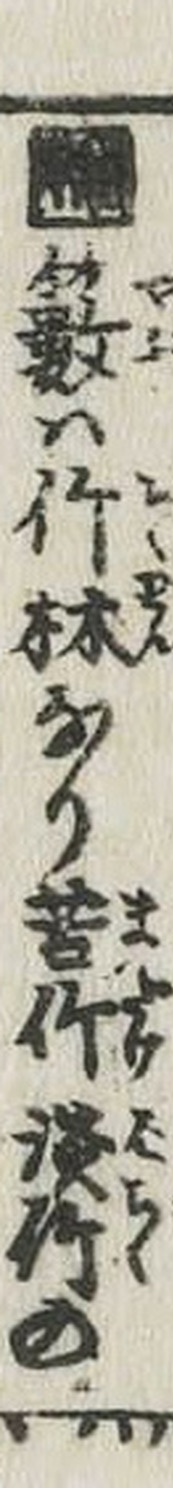補籔は竹林なり若竹淡竹の
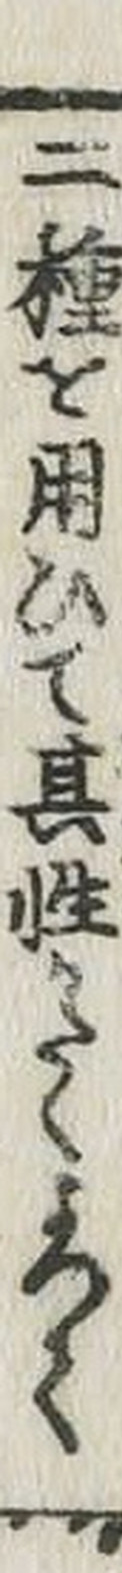二種を用ひて其性かたくよつて
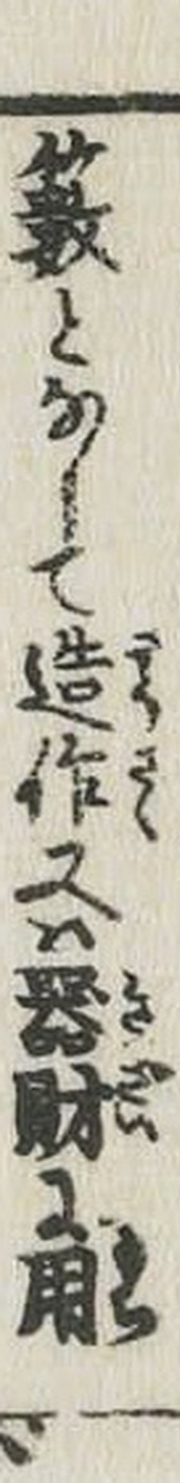籔となして造作又は器財に用
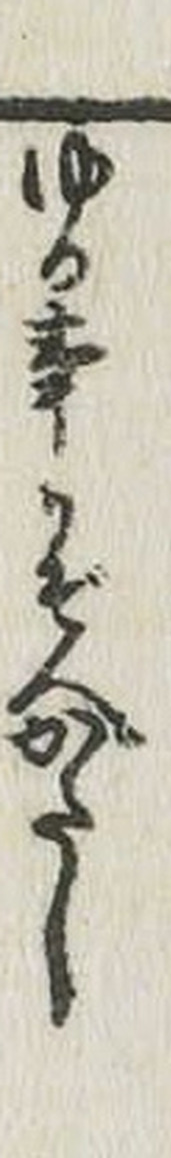ゆる事かぞへがたし
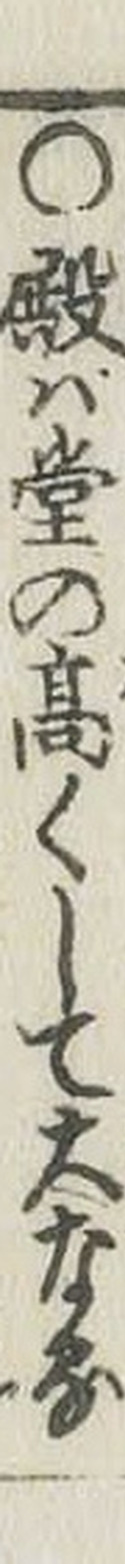○殿は堂の高くして大なる
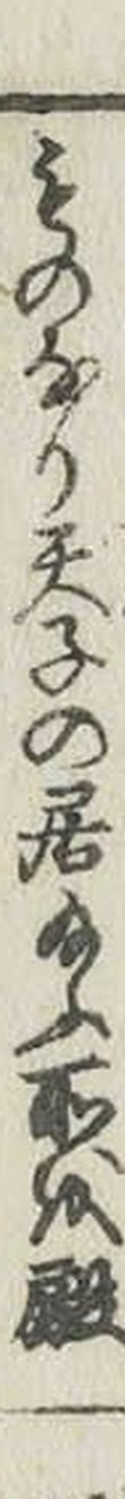ものなり天子の居給ふ所を殿
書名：増補頭書訓蒙図彙大成 10巻 2:巻之1-3
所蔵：東京学芸大学教育コンテンツアーカイブ
